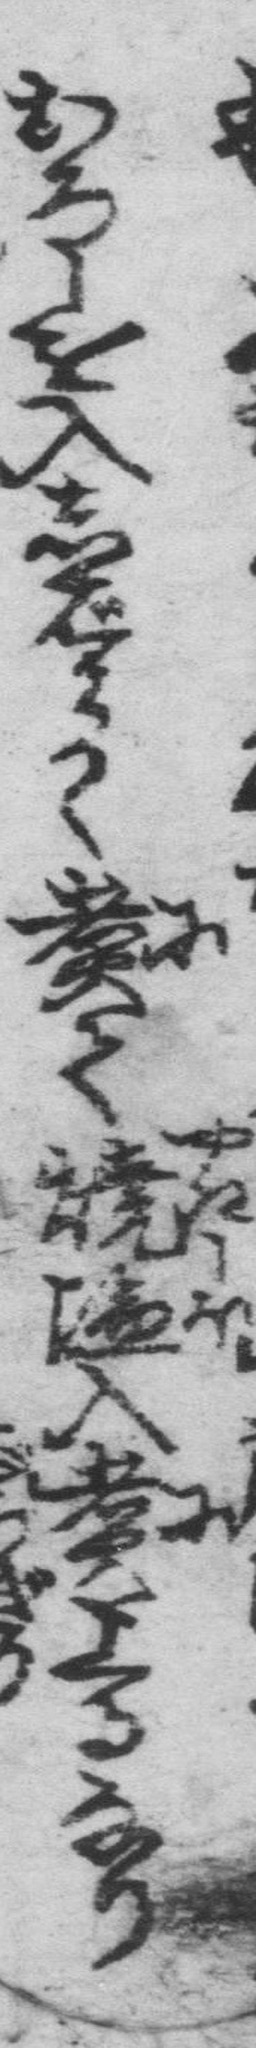おろしを入しばらく煮て焼塩入煮上るなり
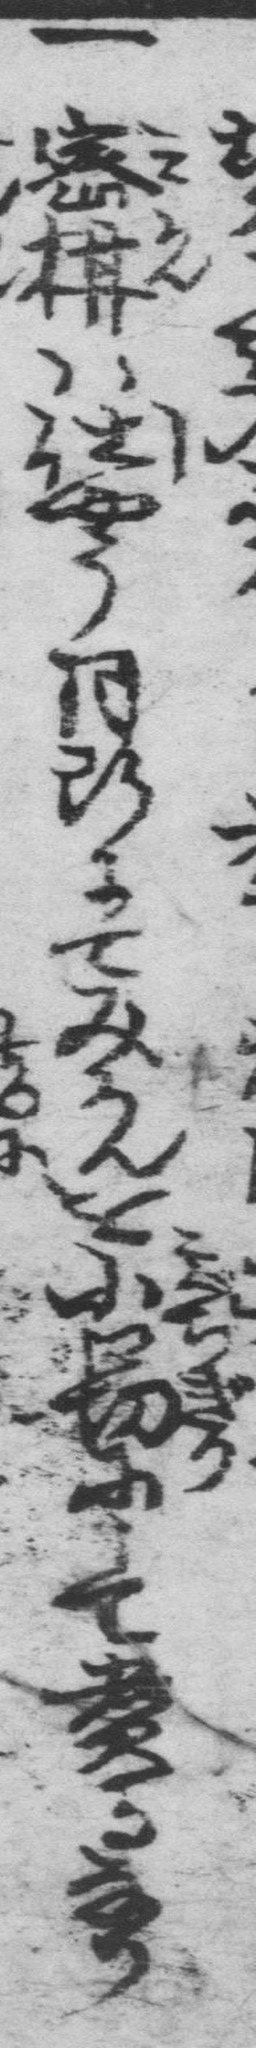一密柑は仕やう同断にてみかんを小口切にして煮るなり
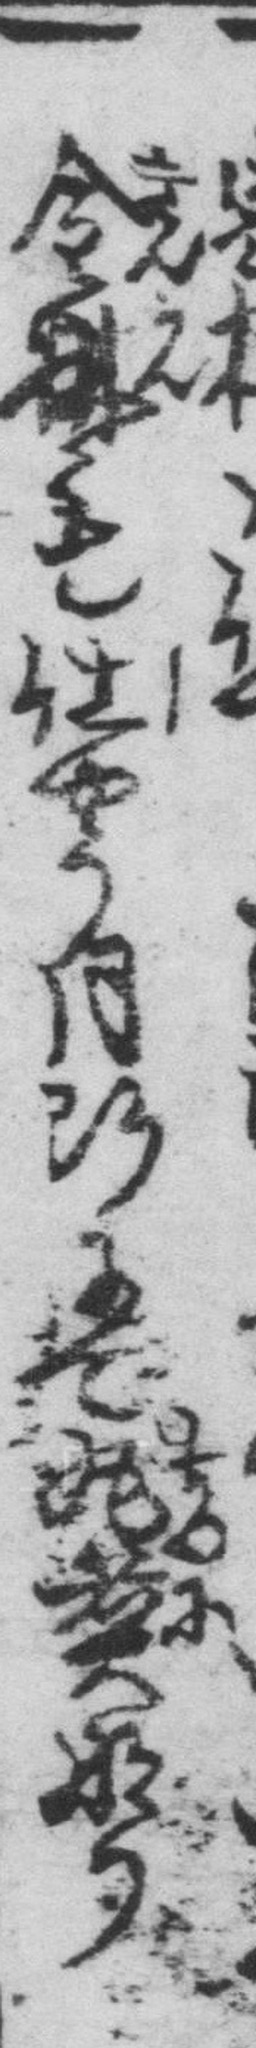一金柑も仕やう同断にて丸煮なり
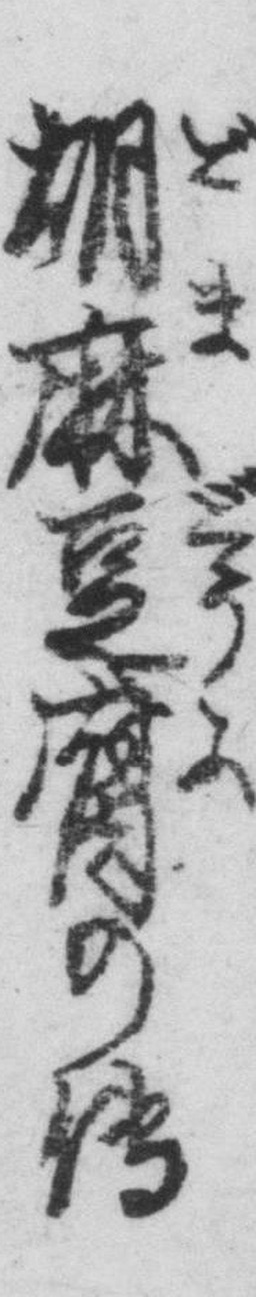胡麻豆腐の伝
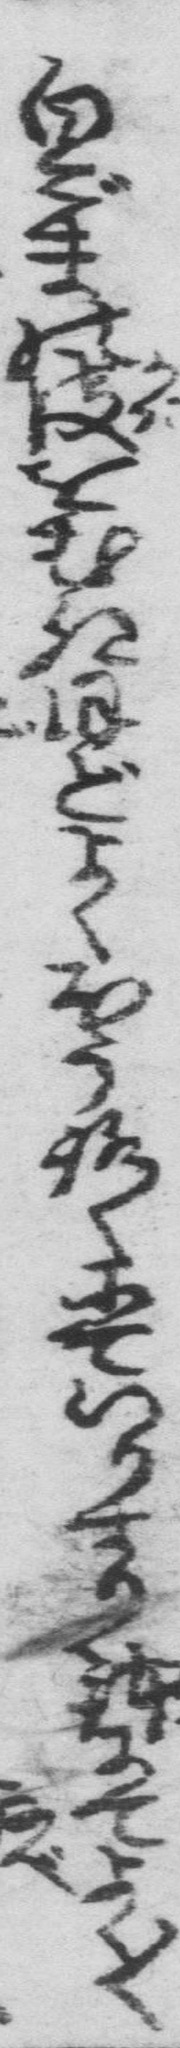一白ごまの皮をむきほどよくほうろくにていりすり鉢にてよく〳〵
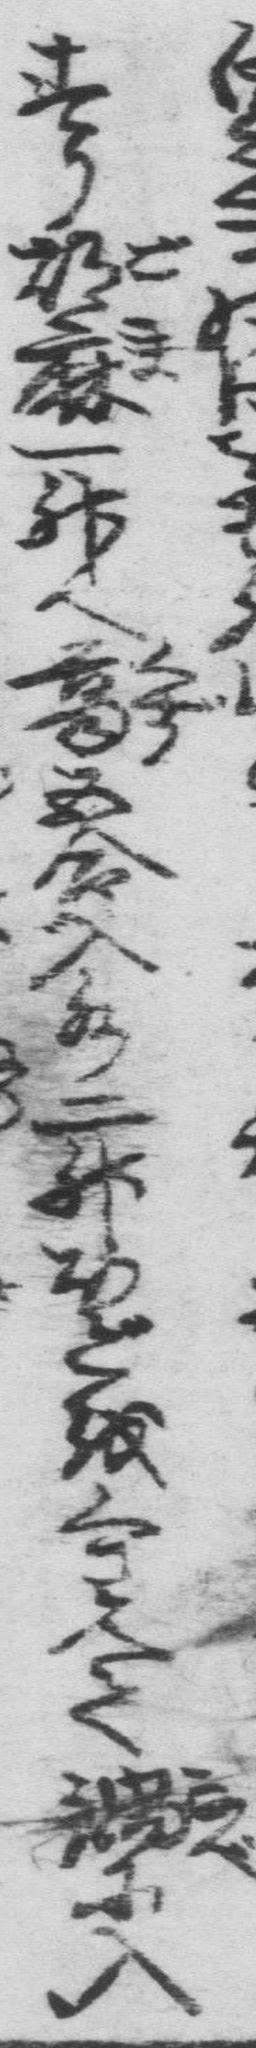すり胡麻一升へ葛五合入水二升ほどをくわへて鍋に入
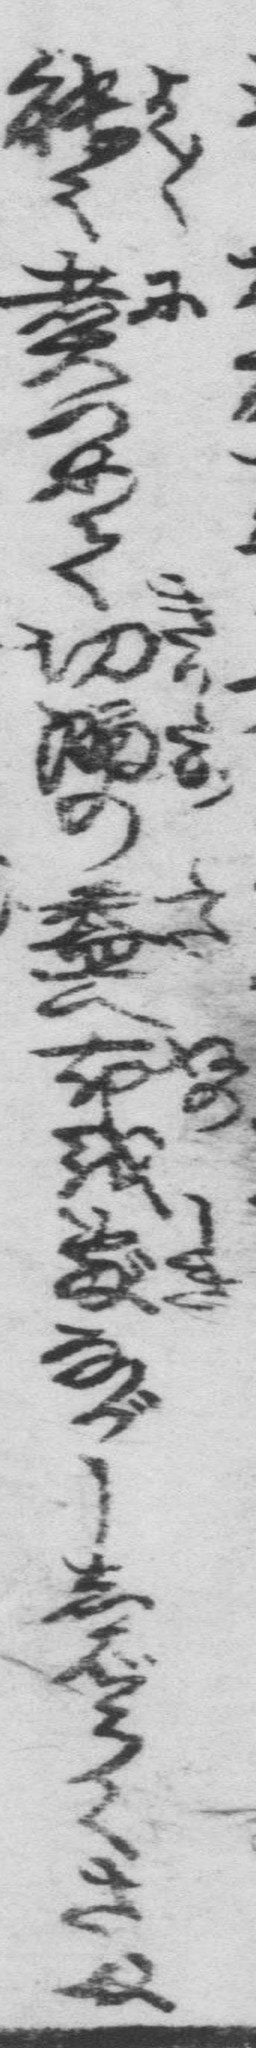能々煮つめて切溜の蓋へ布を敷ながししばらくさま
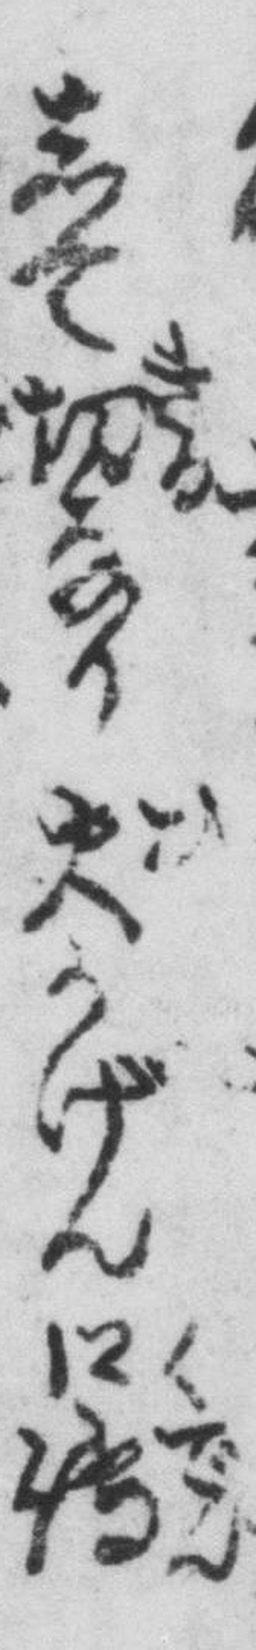して切なり火かげん口伝
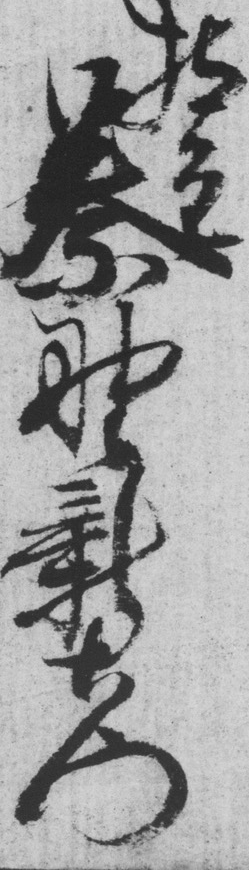秦野新右衛門
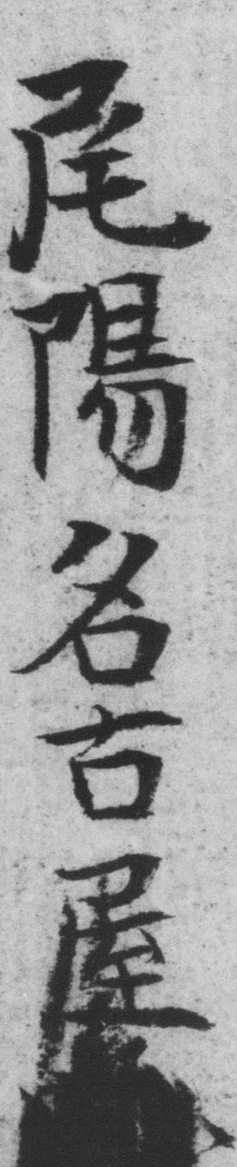尾陽名古屋
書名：即席庖丁
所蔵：大阪府立大学学術情報センター 国文学研究資料館
